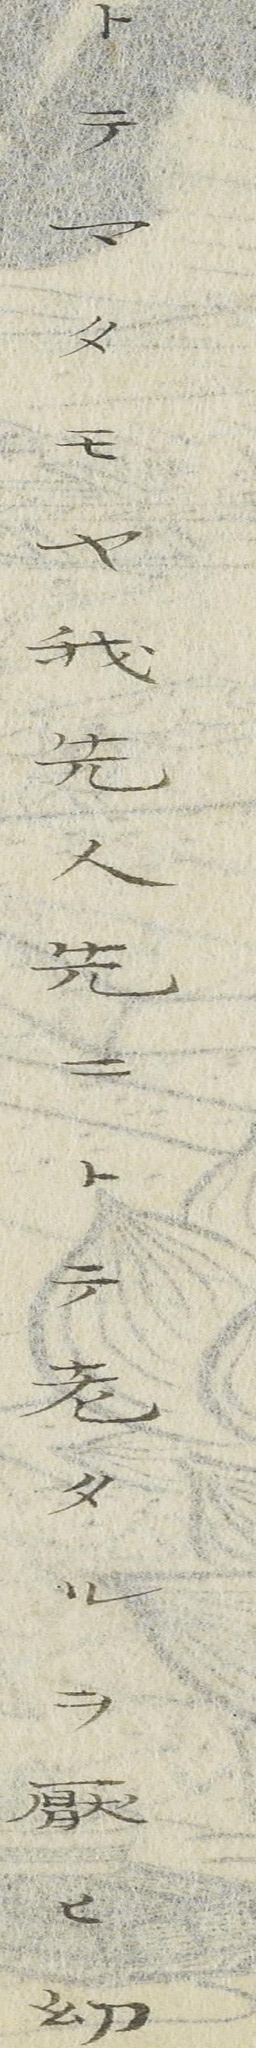トテマタモヤ我先人先ニトテ老タルヲ厭ヒ幼
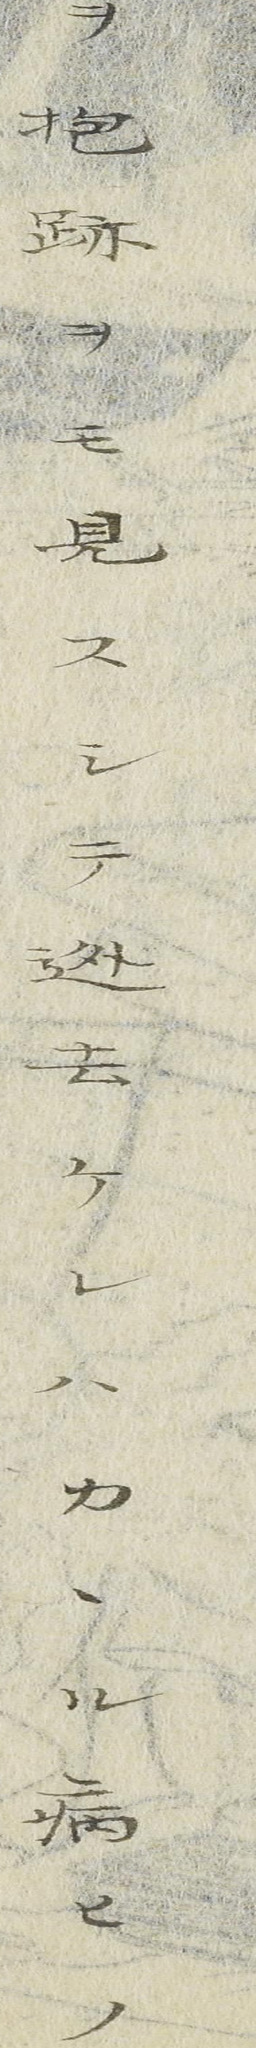ヲ抱跡ヲモ見スシテ迯去ケレハカヽル病ヒノ
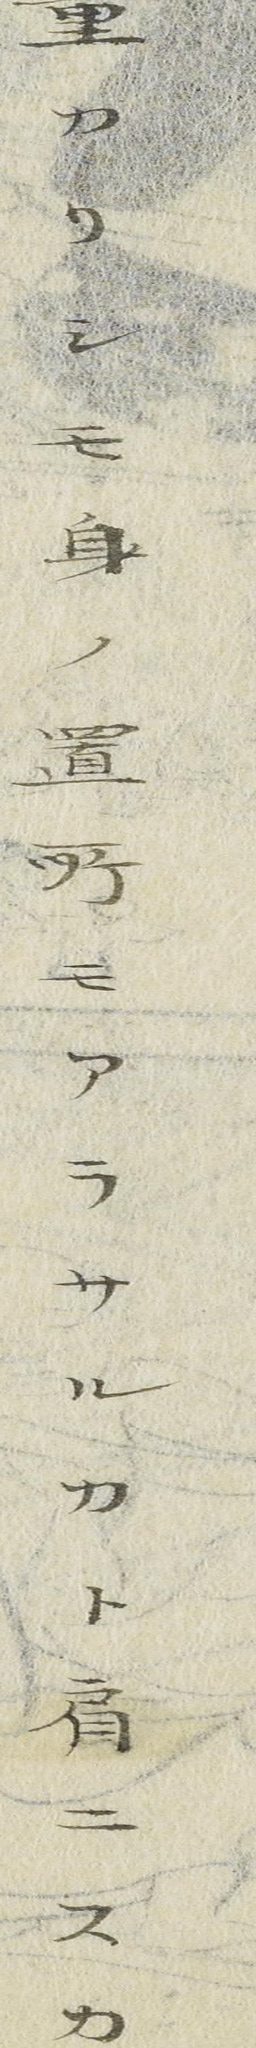重カリシモ身ノ置所モアラサルカト肩ニスカ
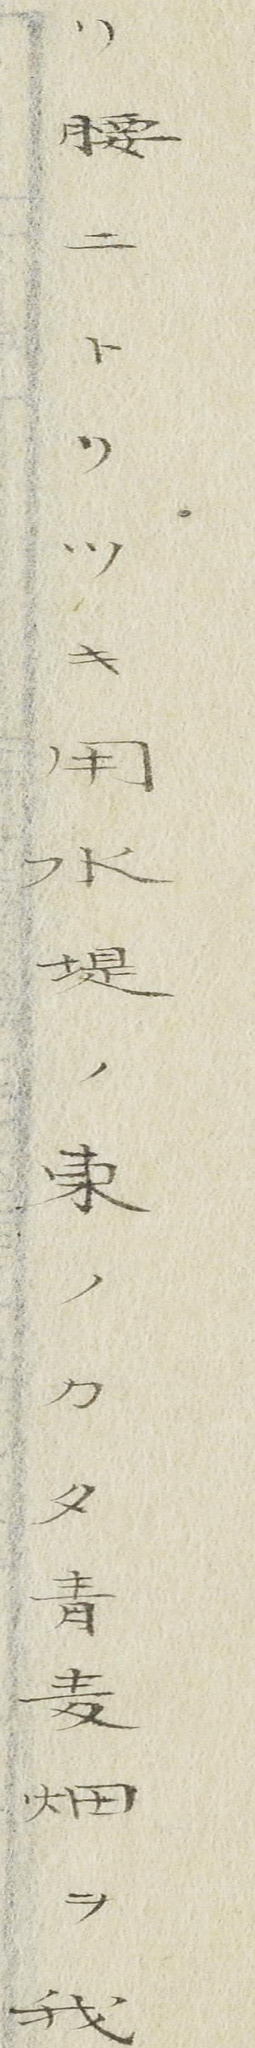リ腰ニトリツキ用水堤ノ東ノカタ青麦畑ヲ我
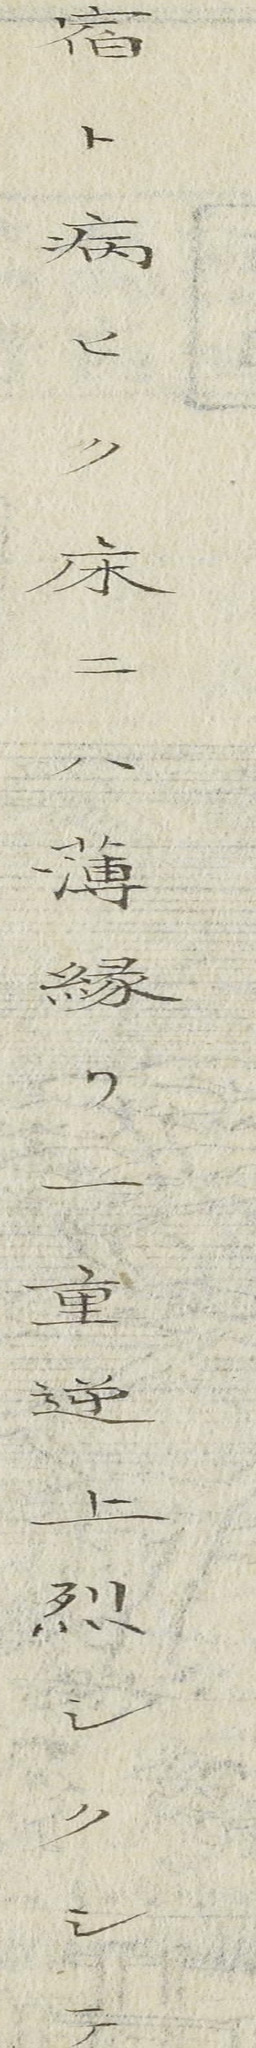宿ト病ヒク床ニハ薄縁リ一重逆上烈シクシテ
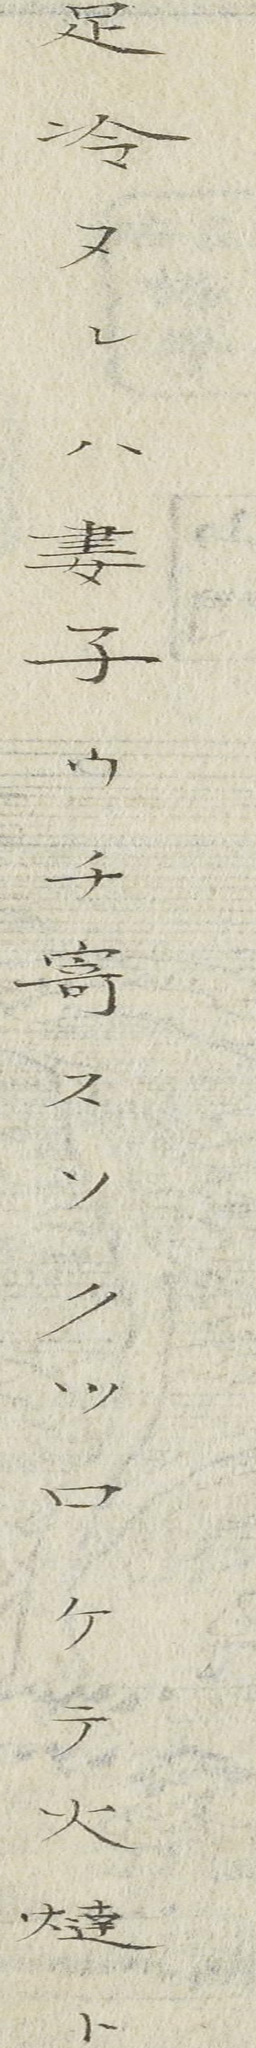足冷ヌレハ妻子ウチ寄スソクツロケテ火燵ト
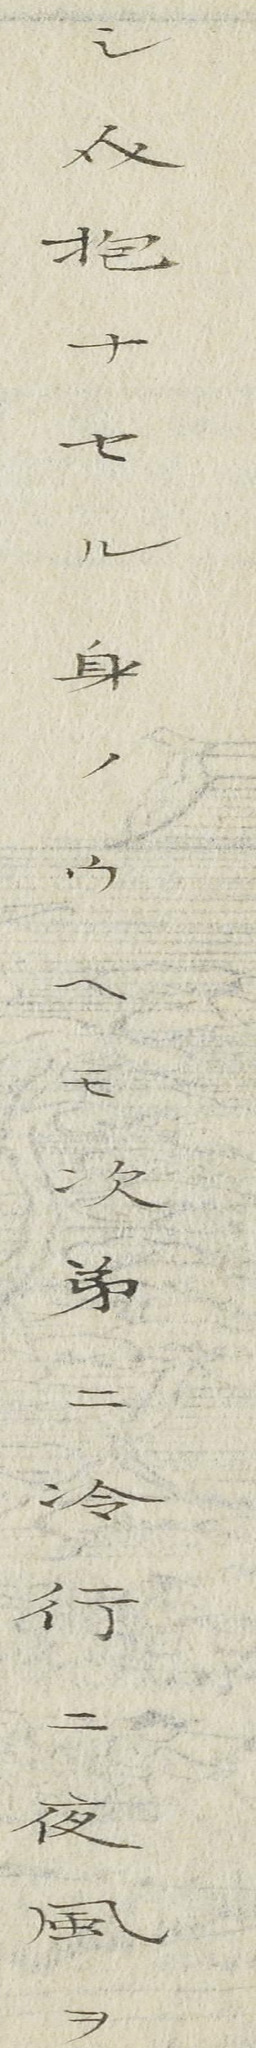シ介抱サセル身ノウヘモ次第ニ冷行ニ夜風ヲ
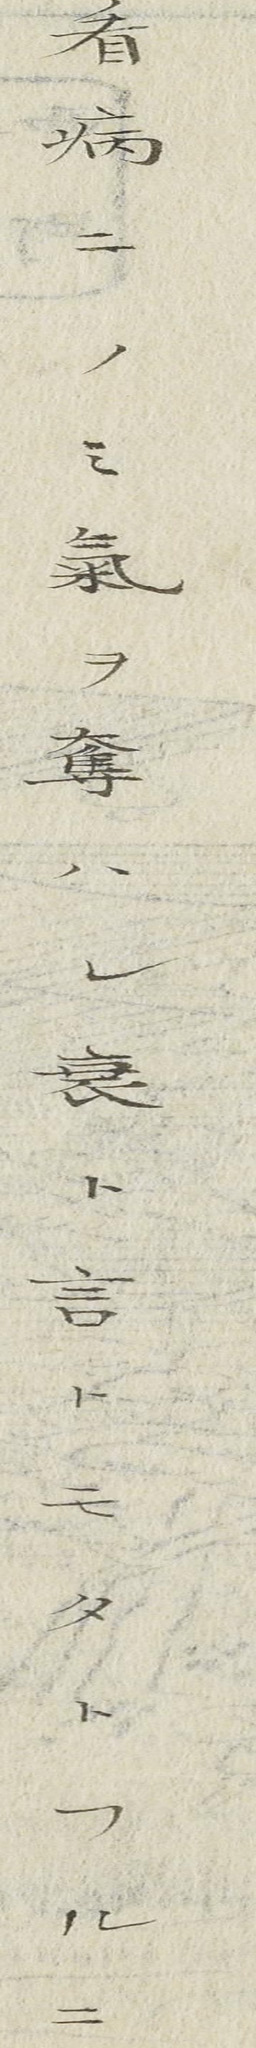看病ニノミ気ヲ奪ハレ衰ト言トモタトフルニ
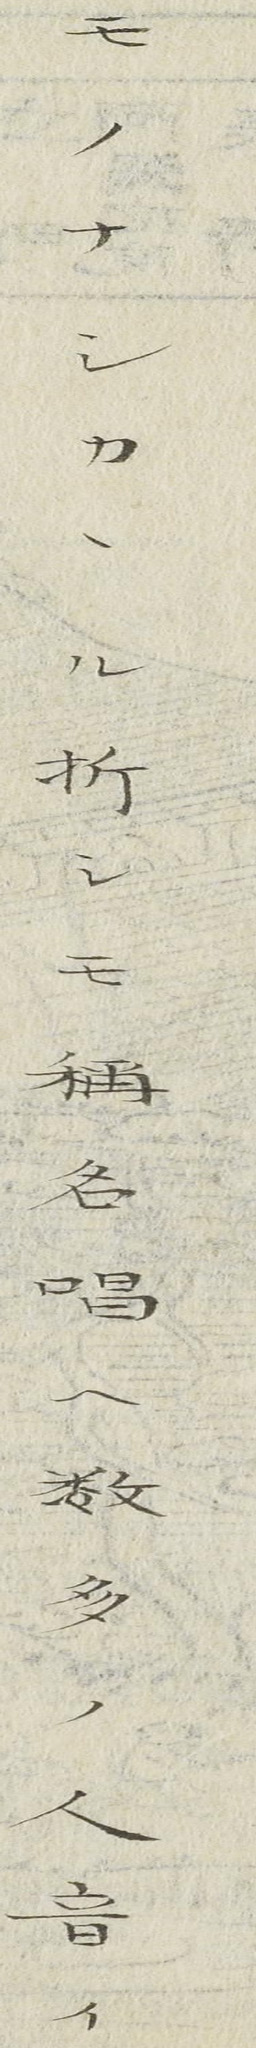モノナシカヽル折シモ称名唱ヘ数多ノ人音イ
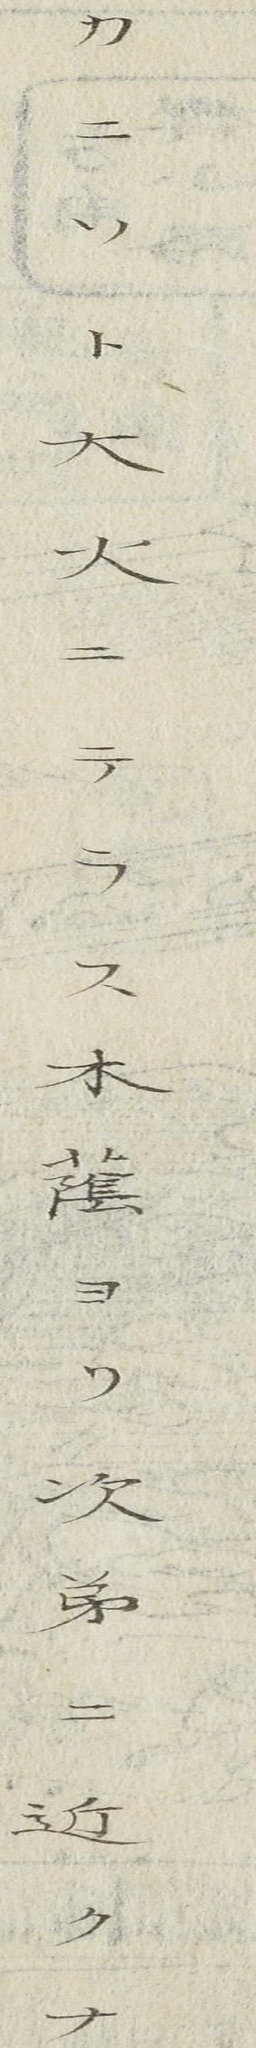カニソト大火ニテラス木蔭ヨリ次第ニ近クナ
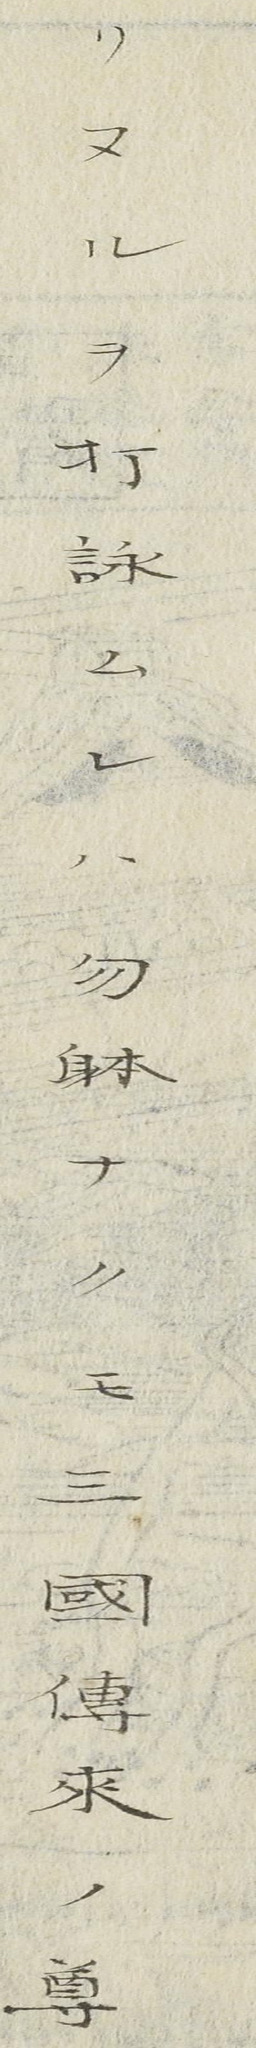リヌルヲ打詠ムレハ勿体ナクモ三国伝来ノ尊
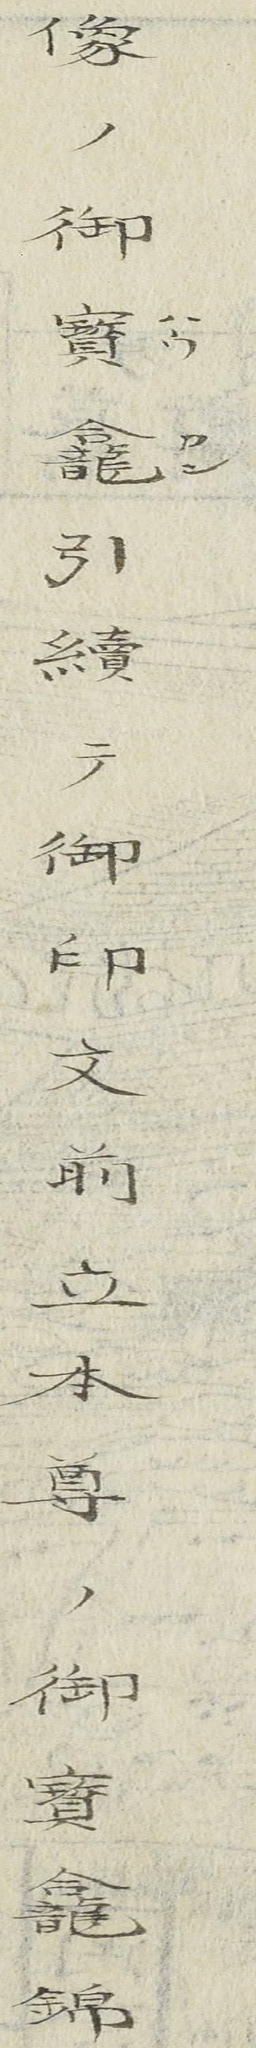像ノ御宝龕引続テ御印文前立本尊ノ御宝龕錦
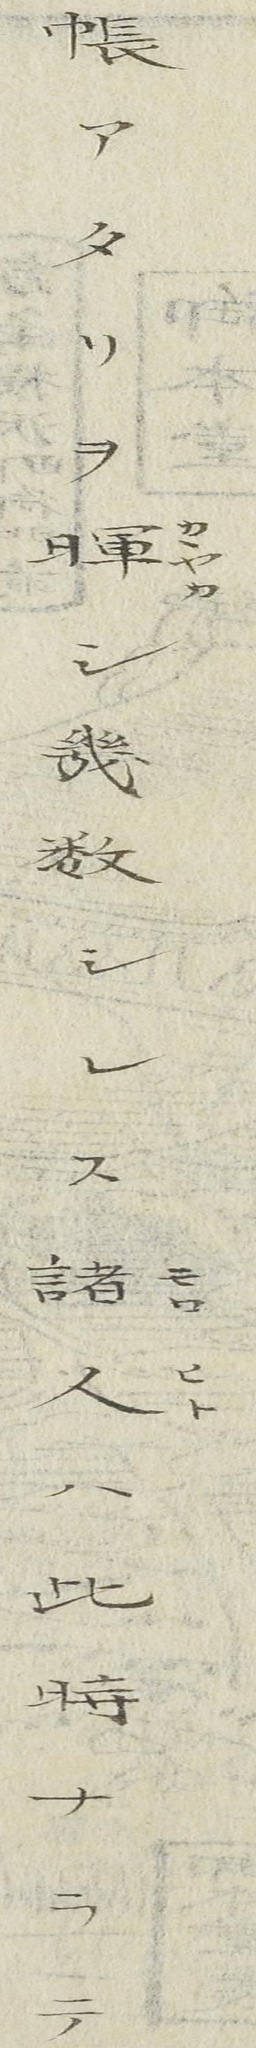帳アタリヲ暉シ幾数シレス諸人ハ此時ナラテ

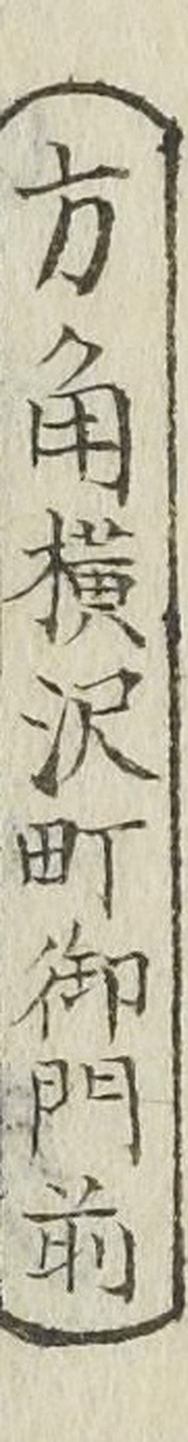方角横沢町御門前

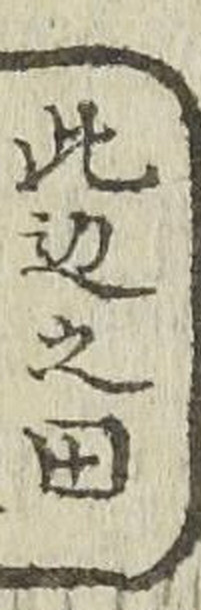此辺之田
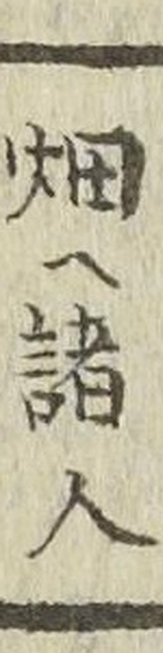畑ヘ諸人
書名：地災撮要　地震之部　巻ノ二
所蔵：東京大学地震研究所図書室 Earthquake Research Institute Library, The University of Tokyo, JAPAN
